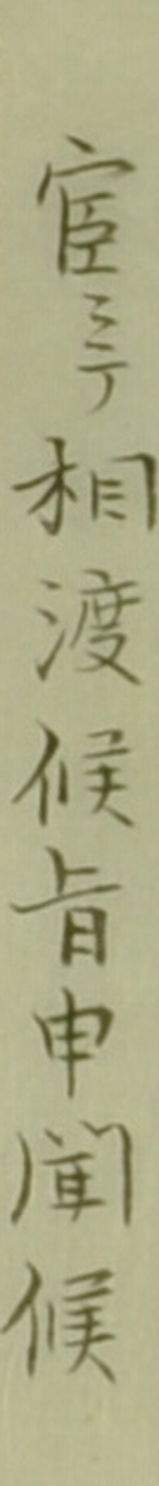宦ニテ相渡候旨申聞候
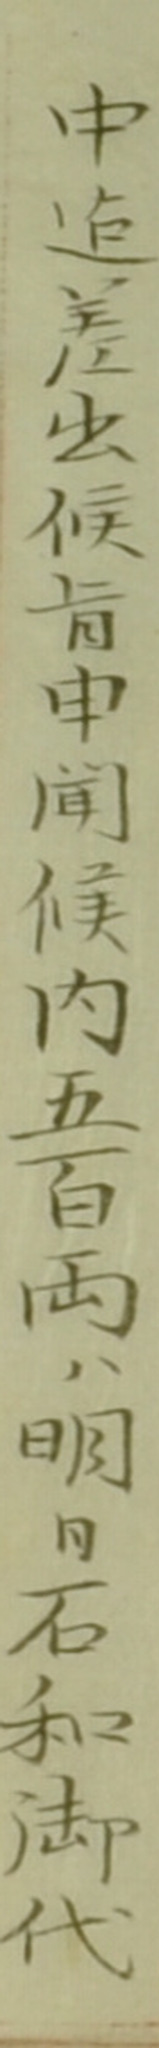中迄差出候旨申聞候内五百両ハ明日石和御代
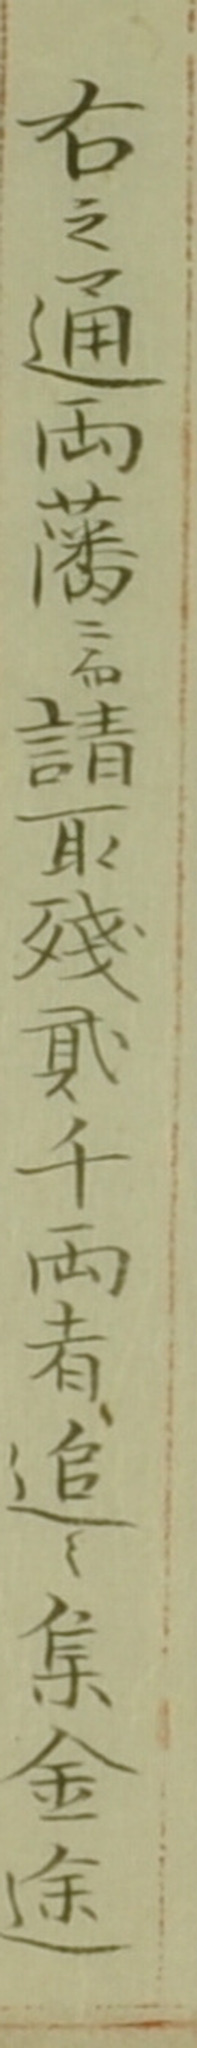右之通両藩ニ而請取残貮千両者追々集金途
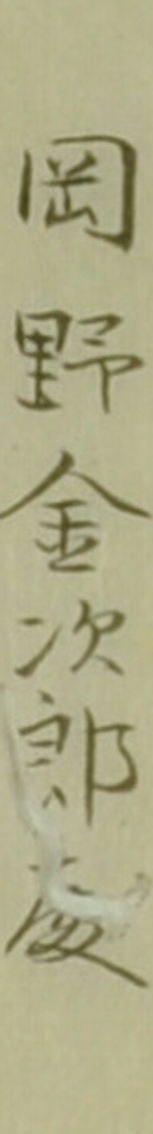岡野金次郎殿
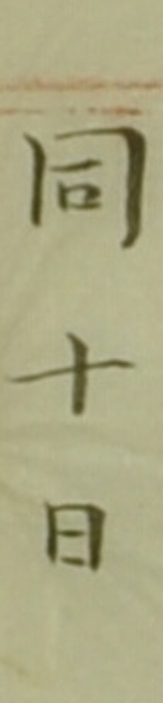同十日
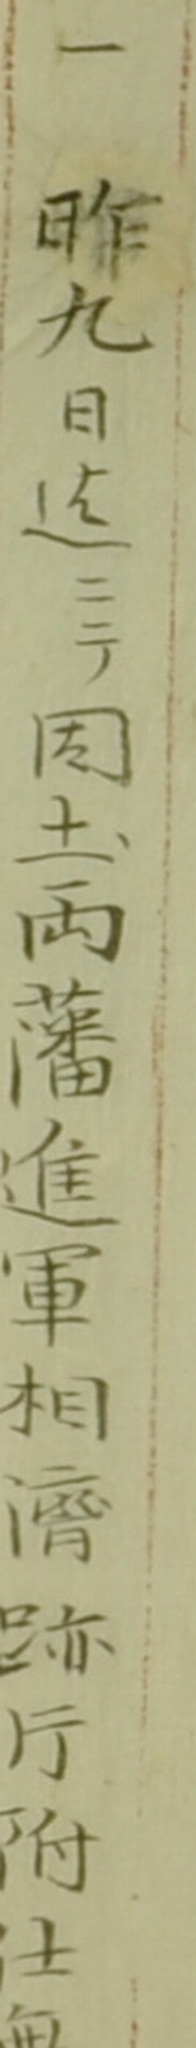一昨九日迄ニテ因土両藩進軍相濟跡片附仕舞
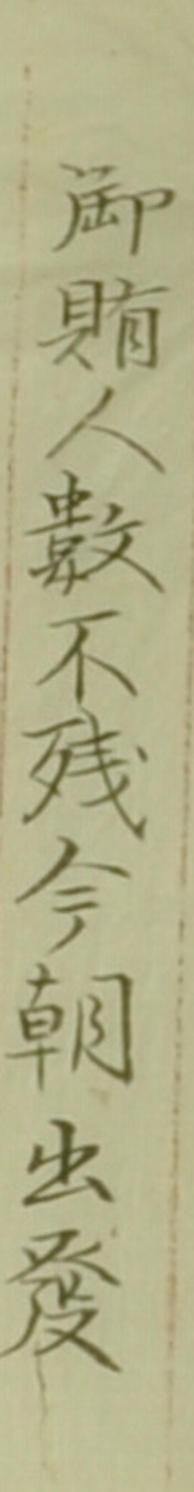御賄人數不残今朝出發
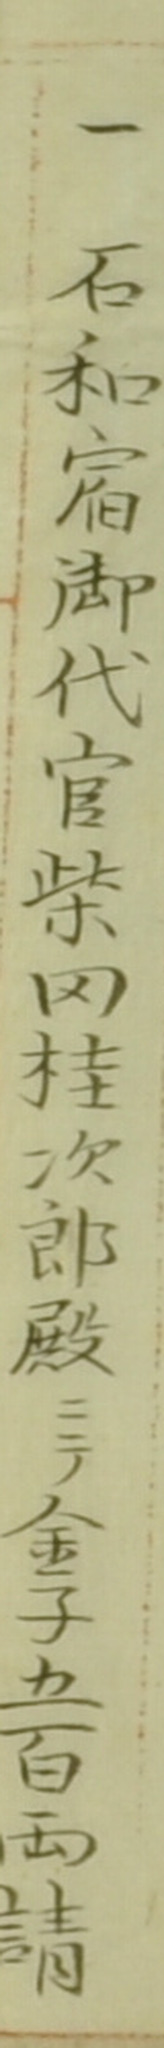一石和宿御代官柴田桂次郎殿ニテ金子五百両請

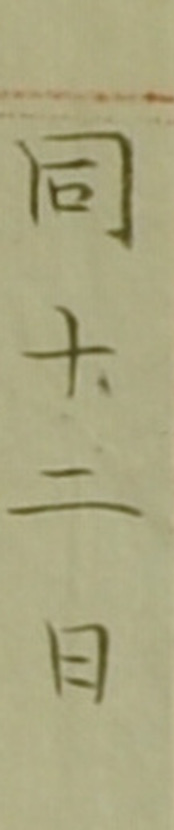同十二日
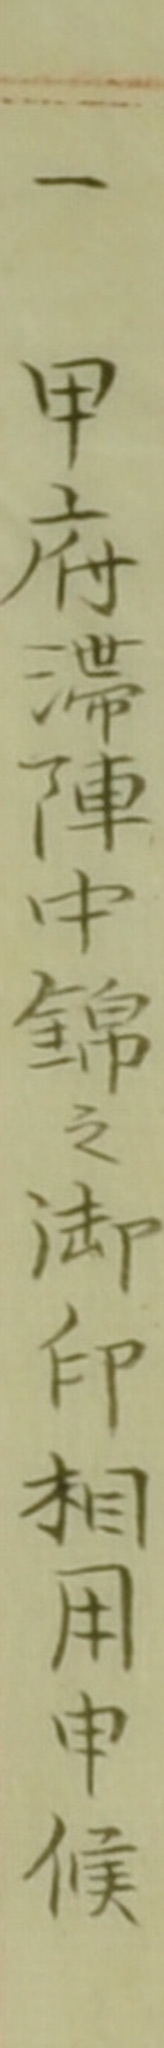一甲府滞陣中錦之御印相用申候
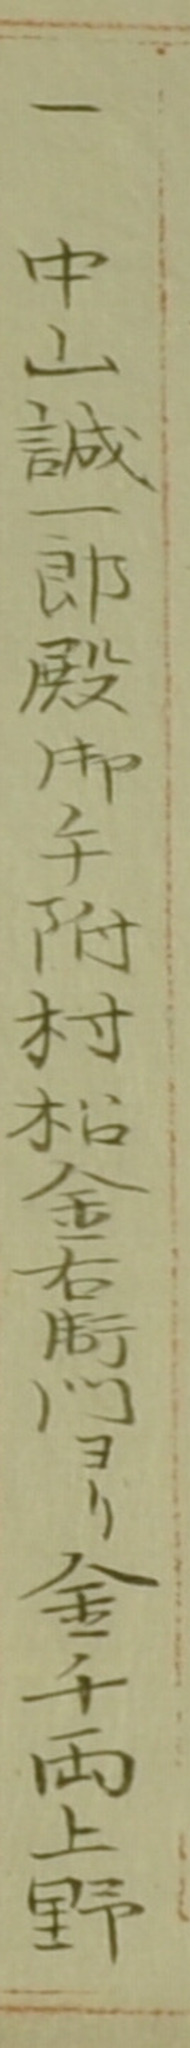一中山誠一郎殿御手附村松蟆金右衛門ヨリ金千両上野
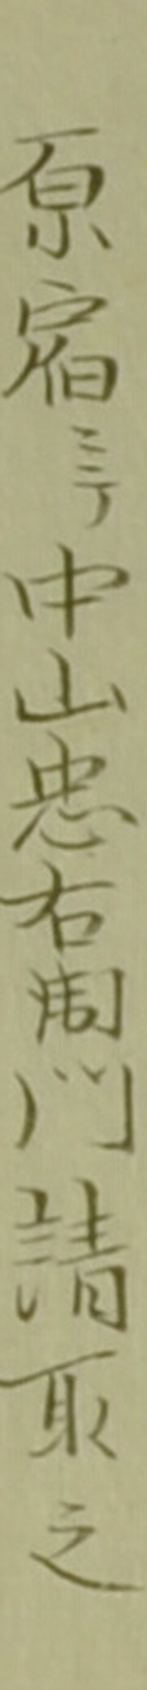原宿ニテ中山忠右衛門請之
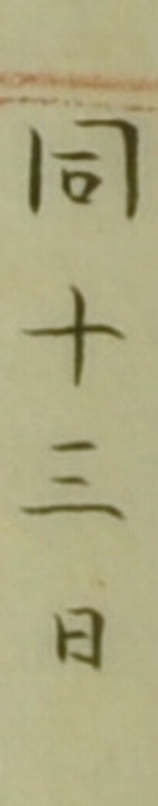同十三日
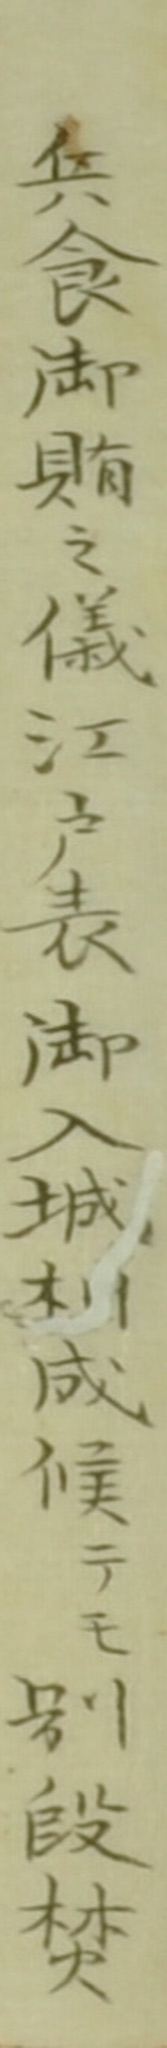一兵食御賄之儀江戸表御入城相成候テモ別段焚
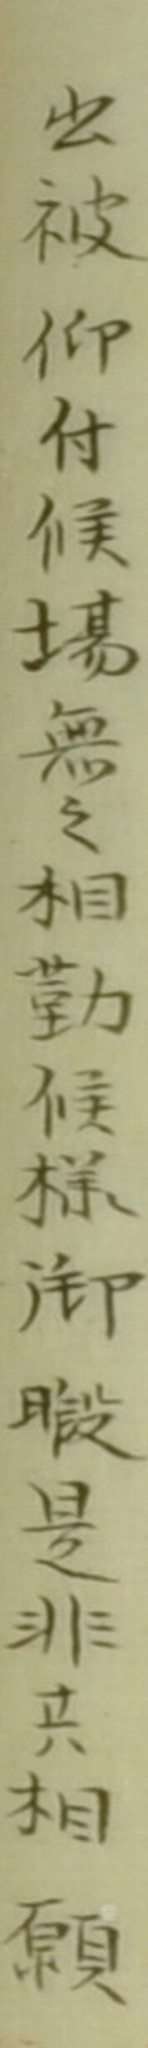出被仰付候場無之相勤候様御暇是非共相願
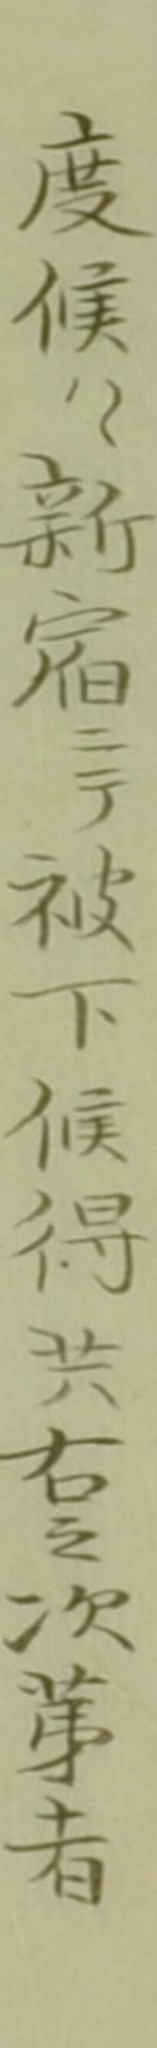度候ハゝ新宿ニテ被下候得共右之次第者者
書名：御東征ニ付甲州口兵食人馬御賄之事件（控）
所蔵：伊那市立高遠町図書館・合同会社AMANE
